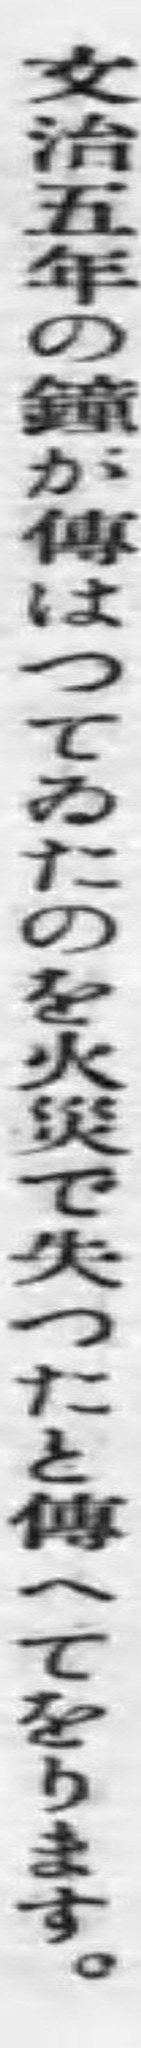文治五年の鐘が伝はつてゐたのを火災で失つたと伝へてをります。
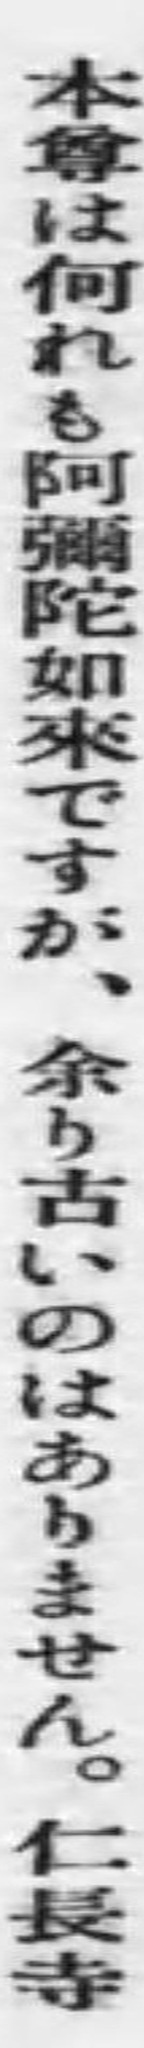本尊は何れも阿弥陀如来ですが、余り古いのはありません。仁長寺

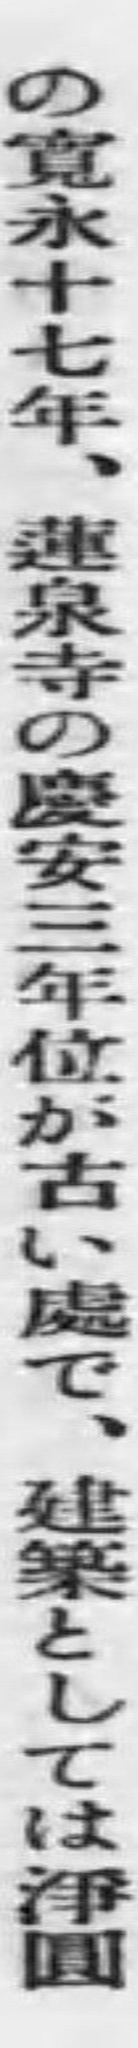の寛永十七年、蓮泉寺の慶安三年位が古い処で、建築としては浄円
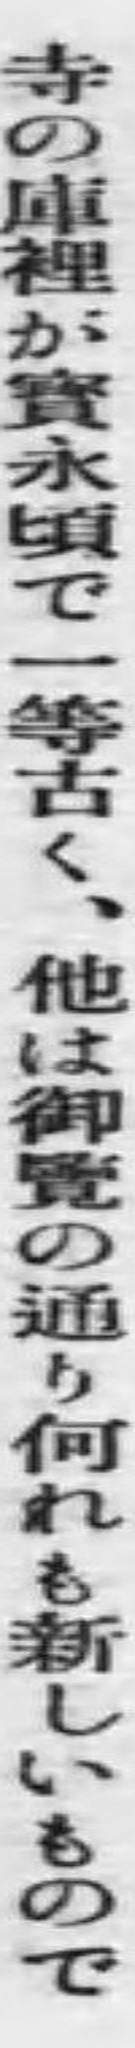寺の庫裡が宝永頃で一等古く、他は御覧の通り何れも新しいもので
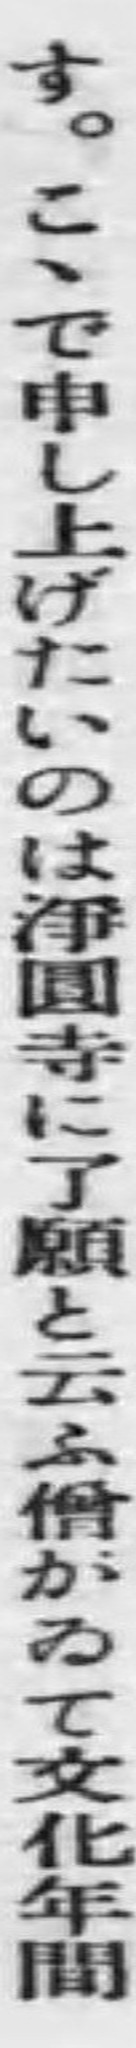す。こゝで申し上げたいのは浄円寺に了願と云ふ僧がゐて文化年間
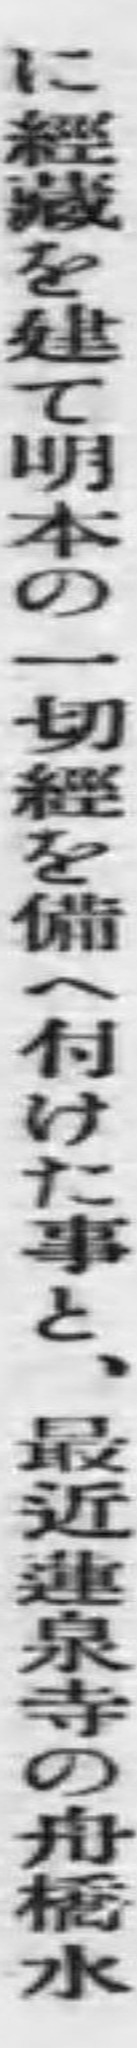に経蔵を建て明本の一切経を備へ付けた事と、最近蓮泉寺の舟橋水
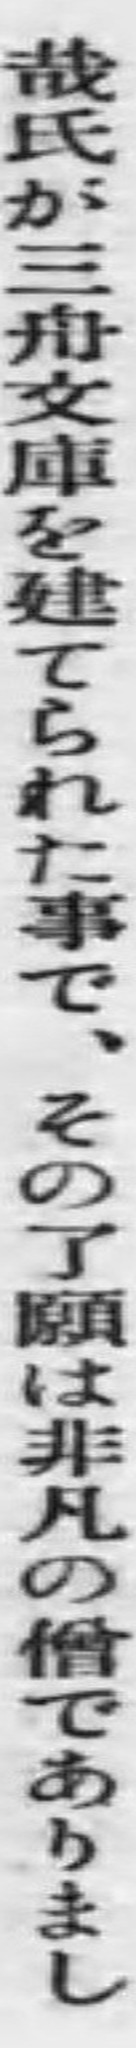哉氏が三舟文庫を建てられた事で、その了願は非凡の僧でありまし
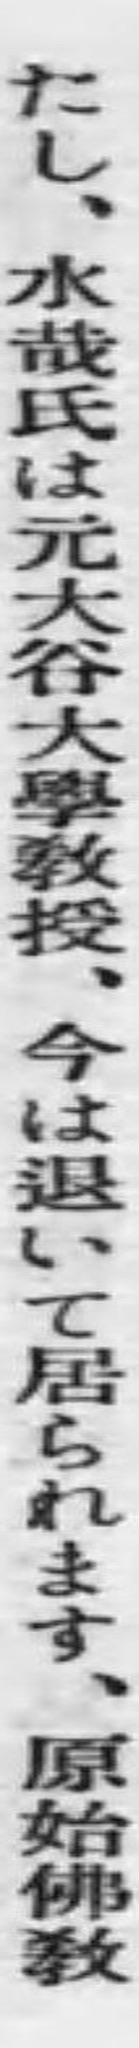たし、水哉氏は元大谷大学教授、今は退いて居られます、原始仏教
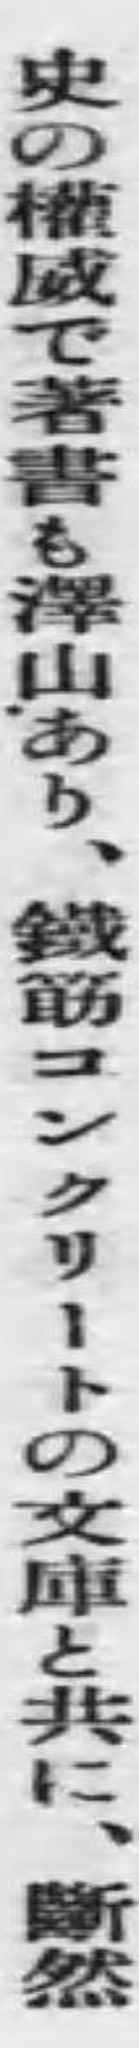史の権威で著書も沢山あり、鉄筋コンクリートの文庫と共に、断然
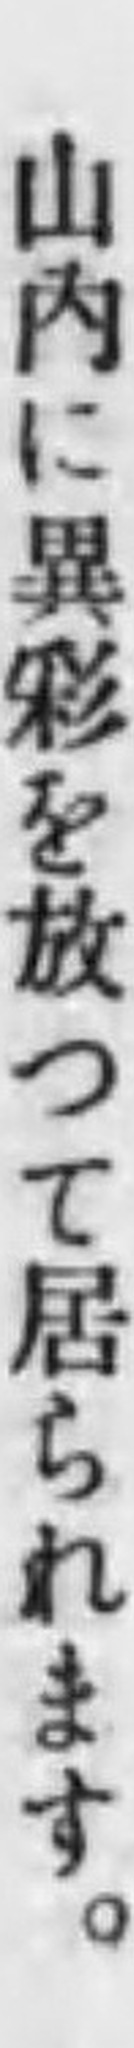山内に異彩を放つて居られます。
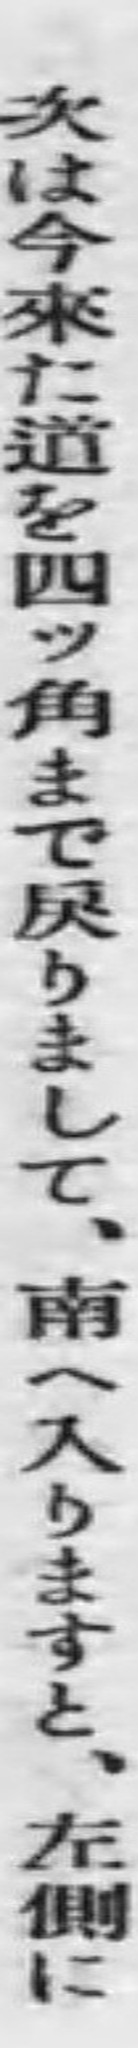次は今来た道を四ッ角まで戻りまして、南へ入りますと、左側に
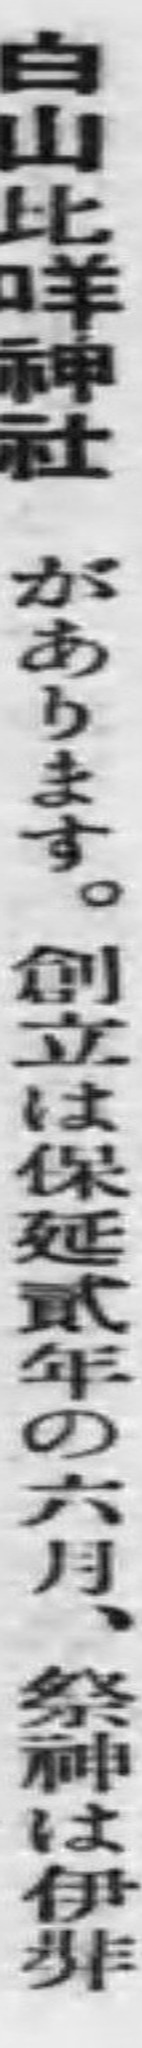白山比咩神社があります。創立は保延弐年の六月、祭神は伊弉
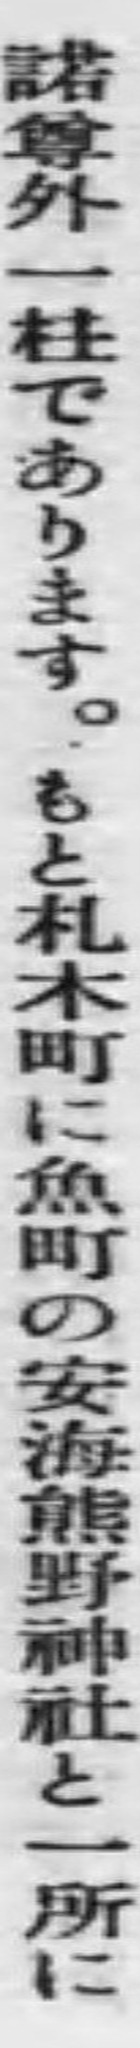諾尊外一柱であります。もと札木町に魚町の安海熊野神社と一所に
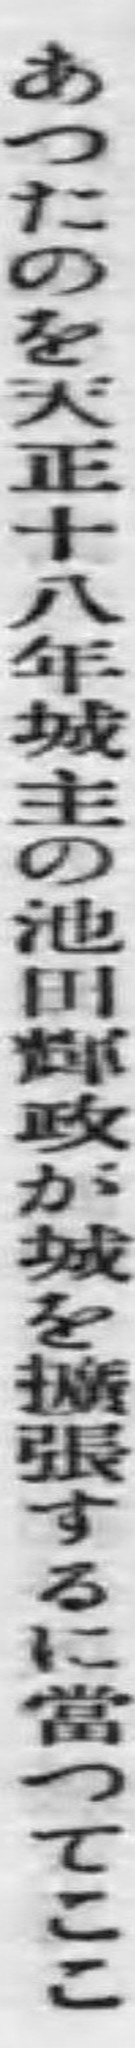あつたのを天正十八年城主の池田輝政が城を城張するに当つてここ
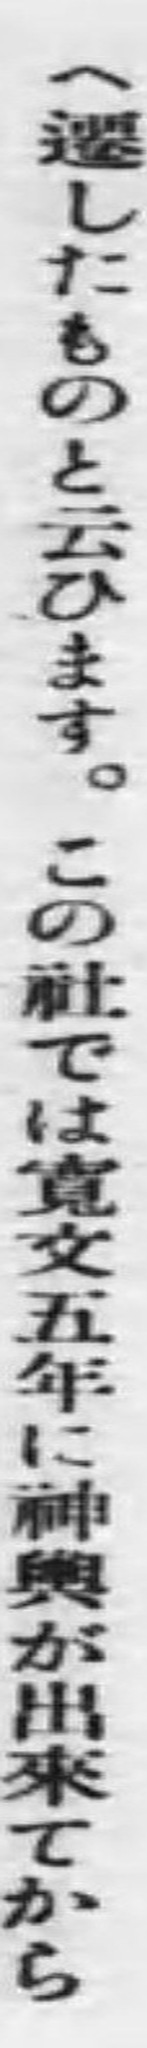へ遷したものと云ひます。この社では寛文五年に神輿が出来てから
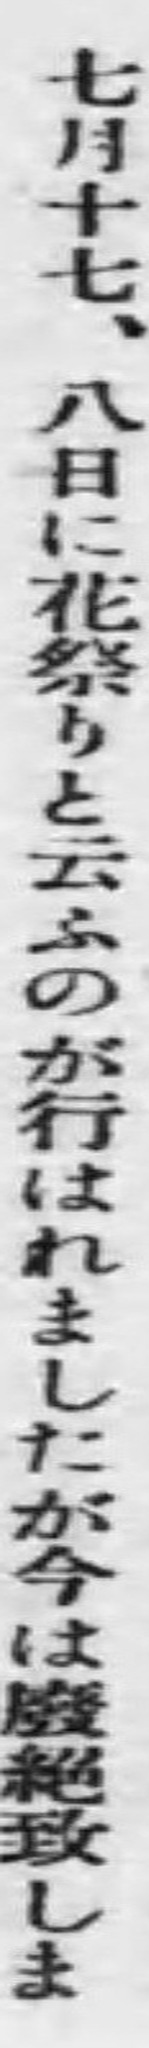七月十七、八日に花祭りと云ふのが行はれましたが今は廃絶致しま
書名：東三河道中記 : 豊橋市及其附近案内
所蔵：国立国会図書館 National Diet Library, JAPAN
